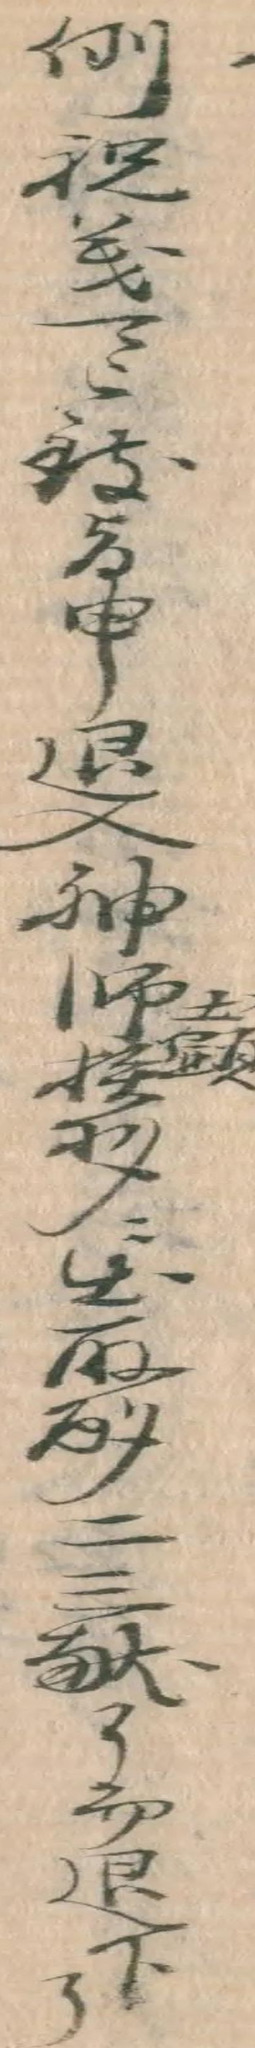例祝義可被致旨申退入神師土顕挨拶ニ出取酌二三献了而退下了
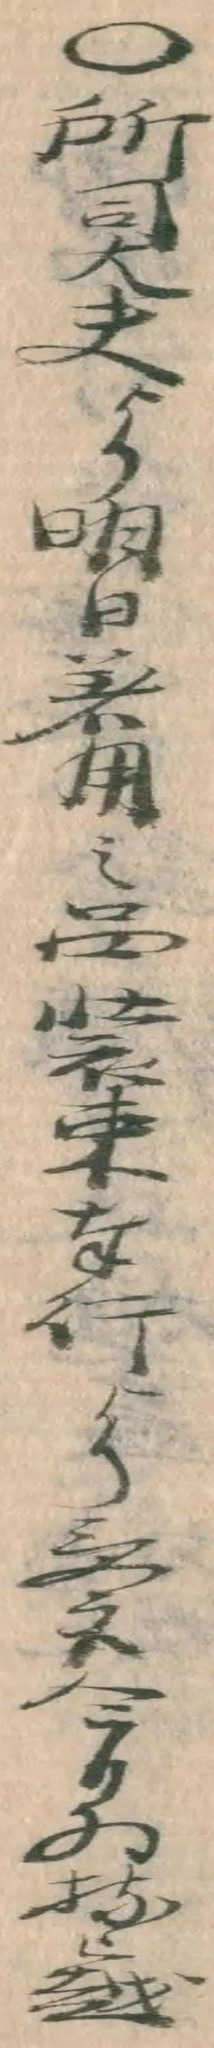〇所司人夫より明日着用之品装束奉行より受取今日為持被越
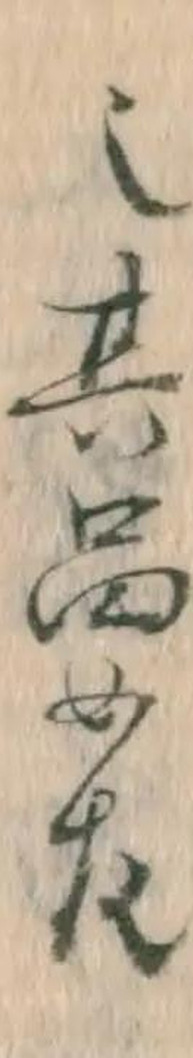之其品如左
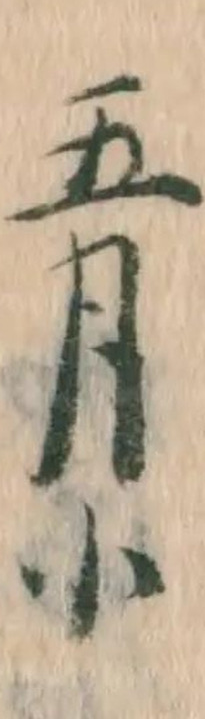五月小
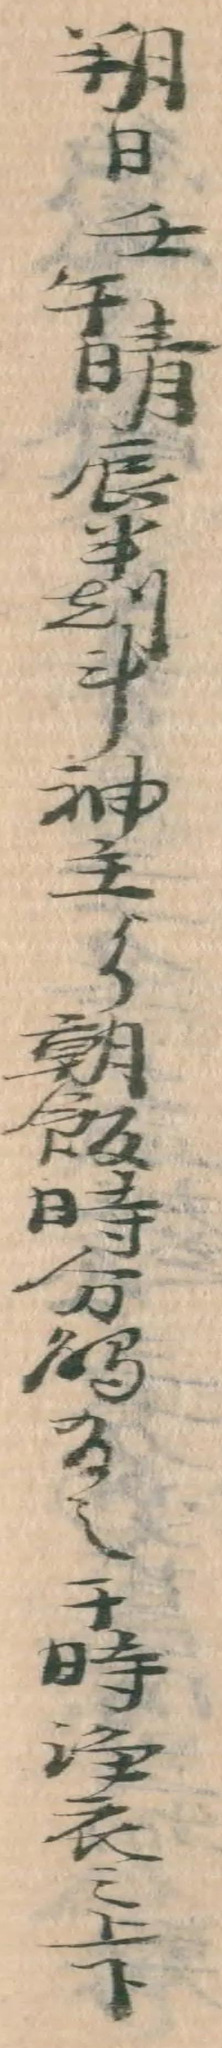朔日壬午晴辰半刻斗神主より朝飯時分触有之于時浄衣之上下
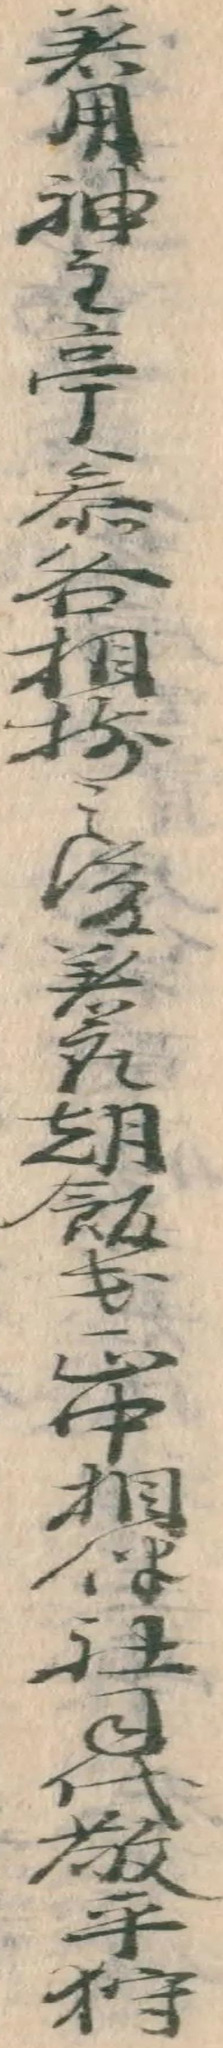着用神主亭へ参各相揃之後着座朝飯義正中相伴社司代敬平狩
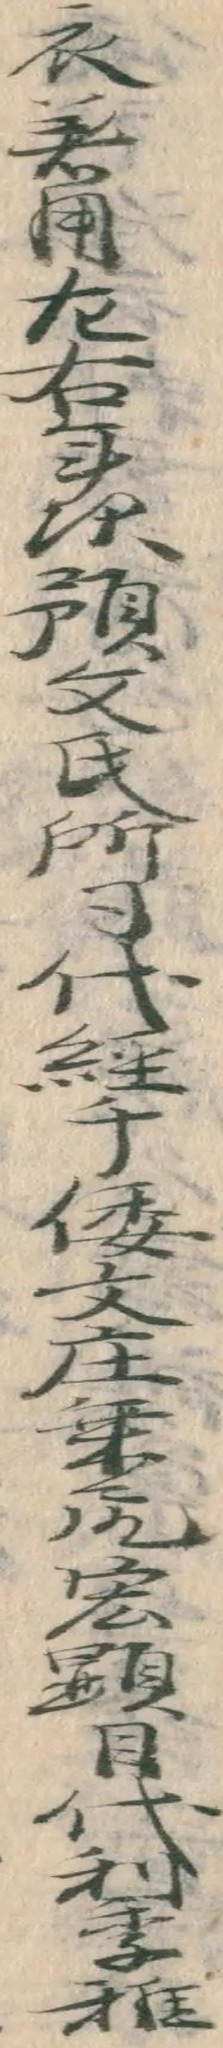衣着用左右年次預文氏所司代経千倭文庄乗尻宏顕目代利季雅
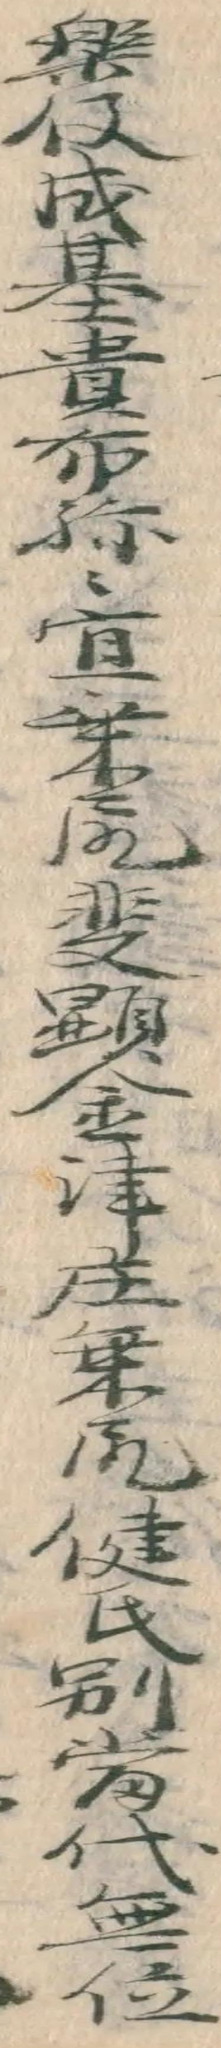楽役成基貴布祢々宜乗尻斐顕金津庄乗尻健氏別当當代無位
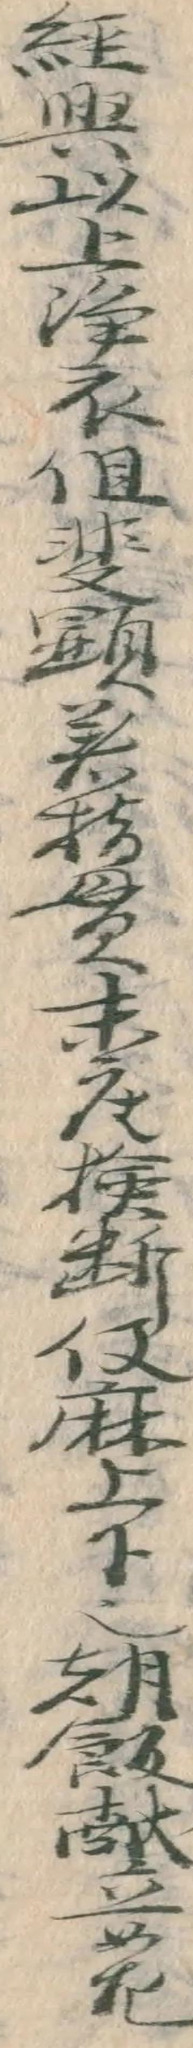経興以上浄衣但斐顕着指貫末座検断仗麻上下也朝飯献立如左
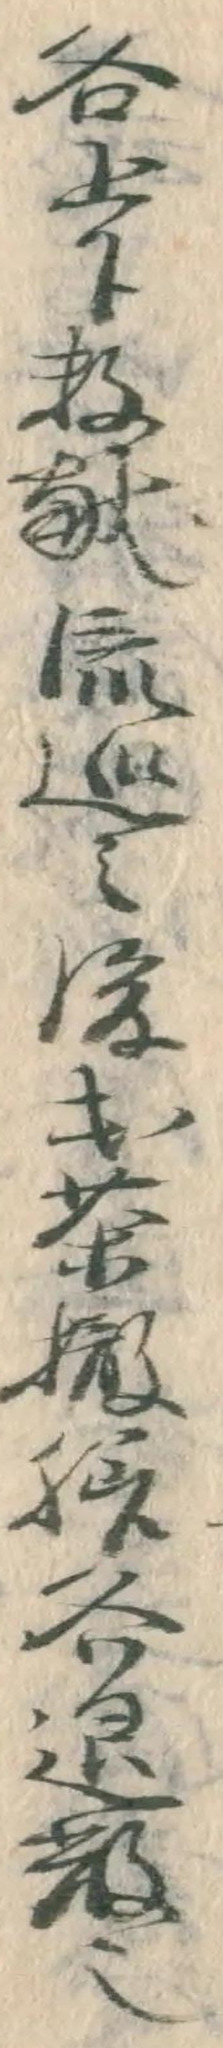各上下数献流巡之後本茶撤各退散之
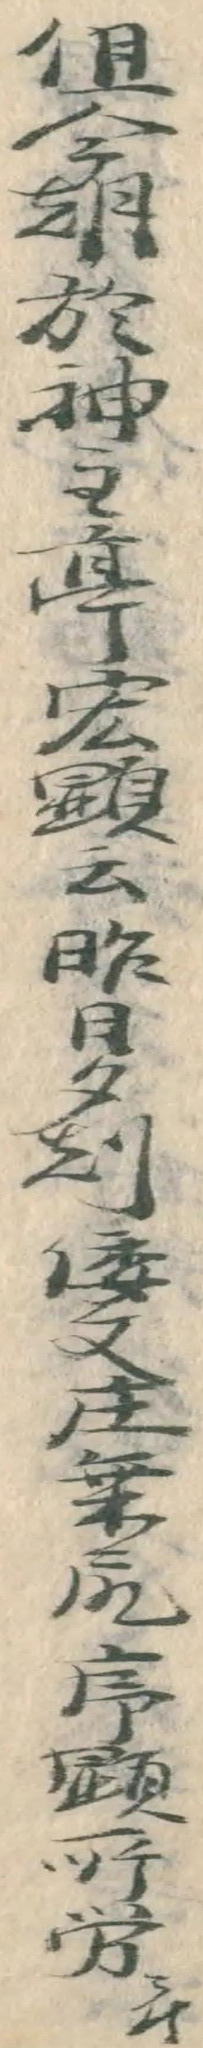但今朝於神主亭宏顕云昨日夕刻倭文庄乗尻序顕所労ニ付

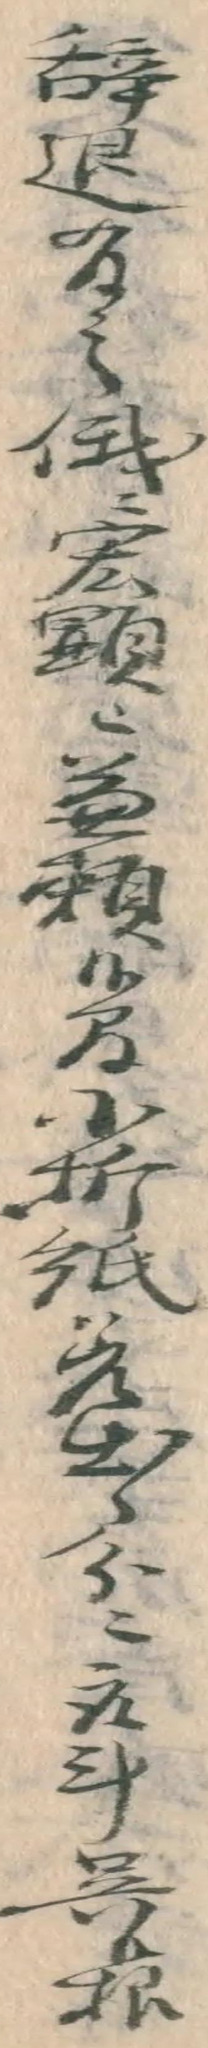辞退有之俄ニ宏顕被兼頼候間小折紙差出候分ニ取斗呉候様
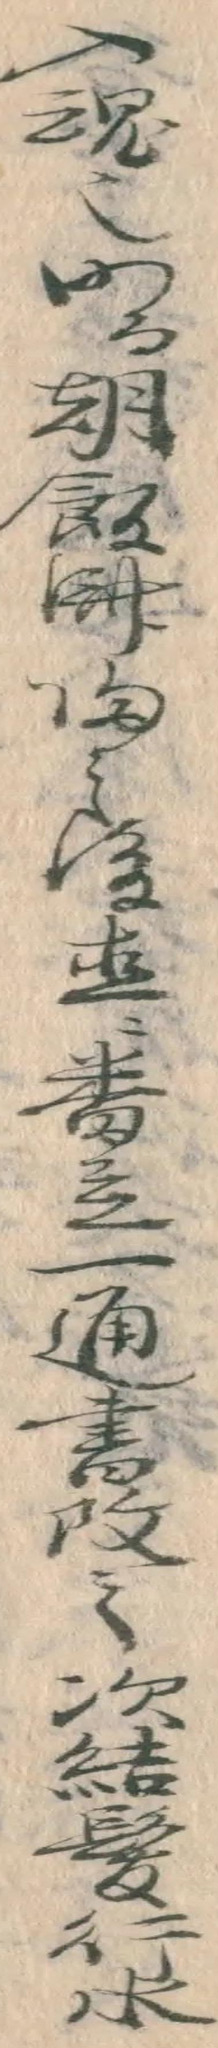入魂也仍而朝飯済帰之後直ニ番立一通書改之次結髪行水
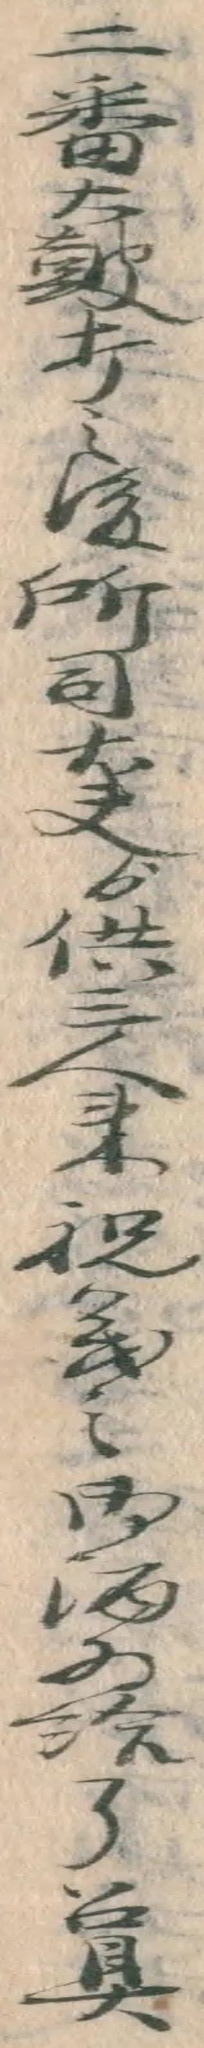二番大鼓打之後所司大夫ゟ供三人来祝義之御酒為給了召具
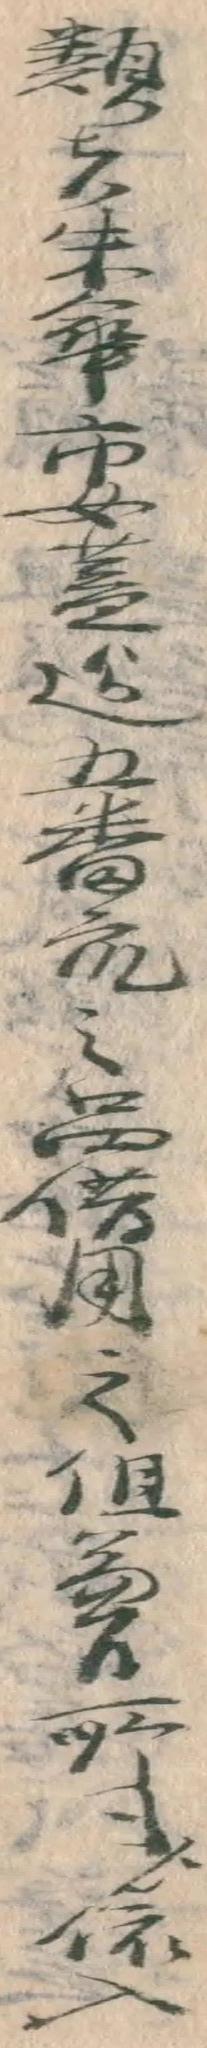類者朱傘市女蓋迄五番衆之品借用之但兼而所もゟ依入
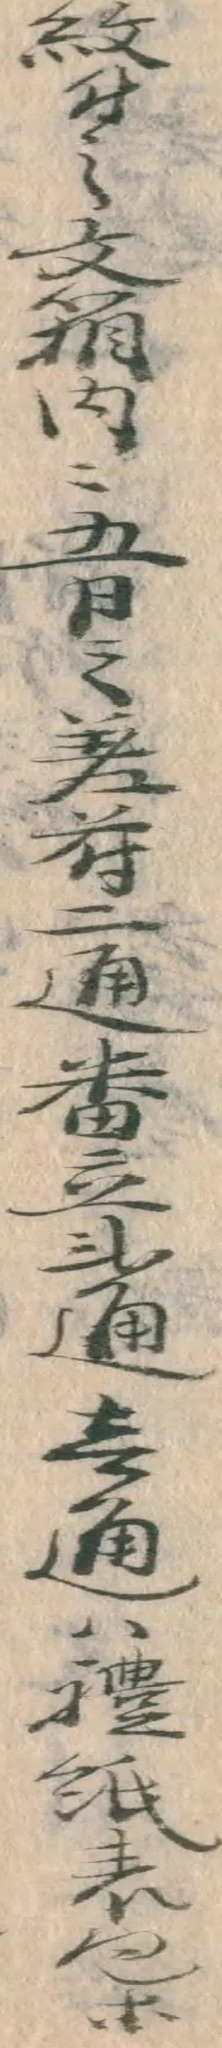紋付之文箱内ニ五日之差符二通番之弐通壱通ハ禮紙表包等
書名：賀茂社記録. 第65冊
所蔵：国立国会図書館 National Diet Library, JAPAN
